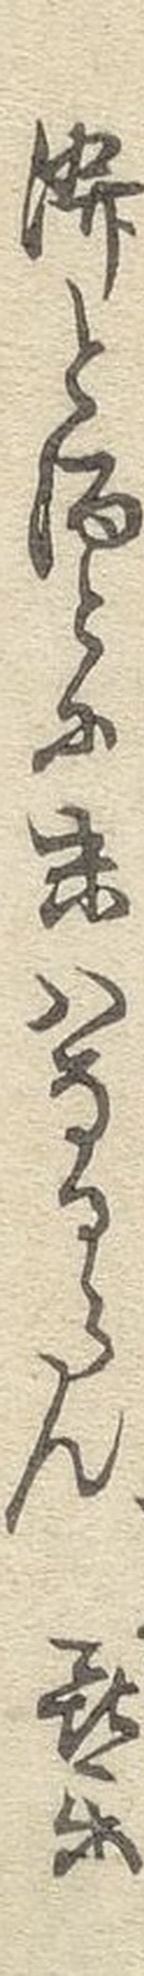餅と酒とに末はなるらん喜楽
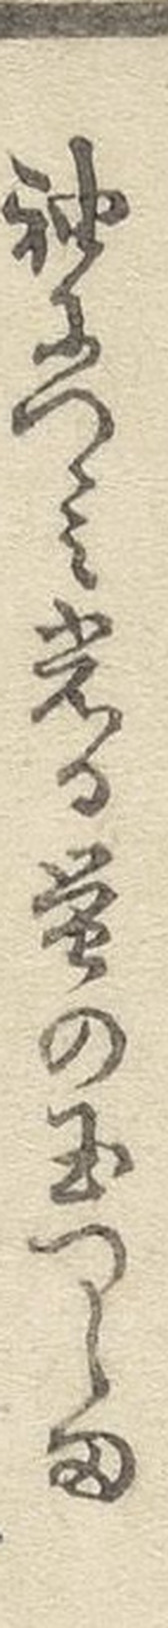袖につゝみ光る蛍の玉つしま
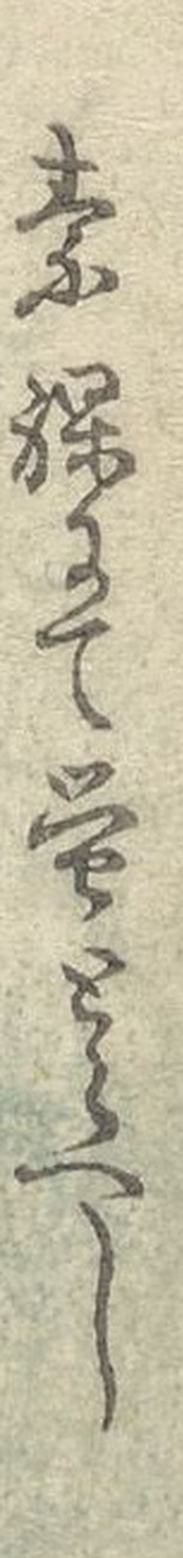素裸にて蛍とらへし
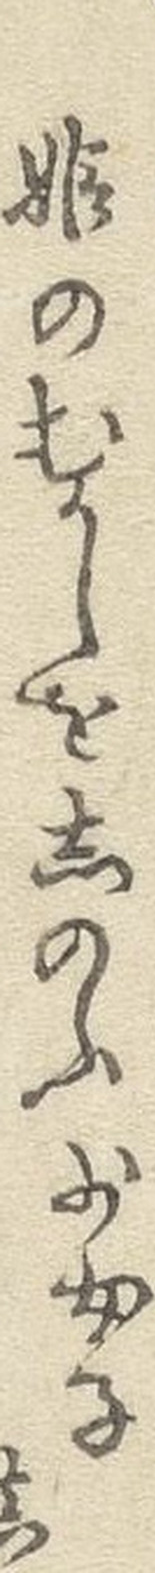姫のむかしをしのふ少女子
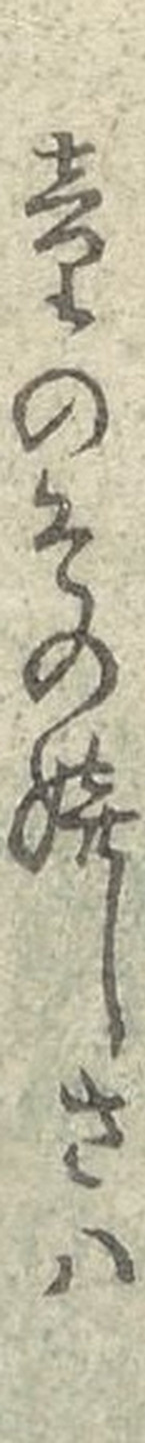童のその嬉しさは
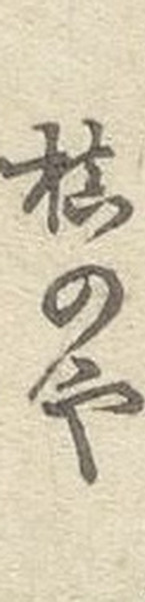槙のや
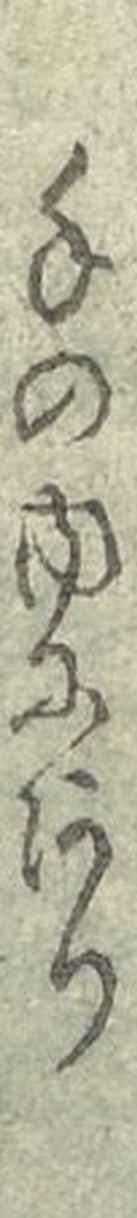手の内にあり
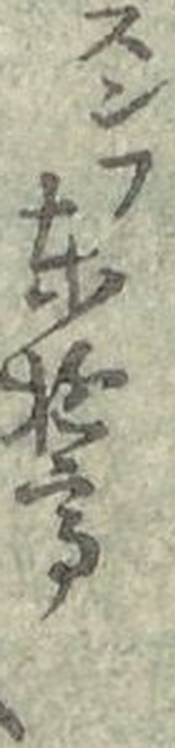東遊亭
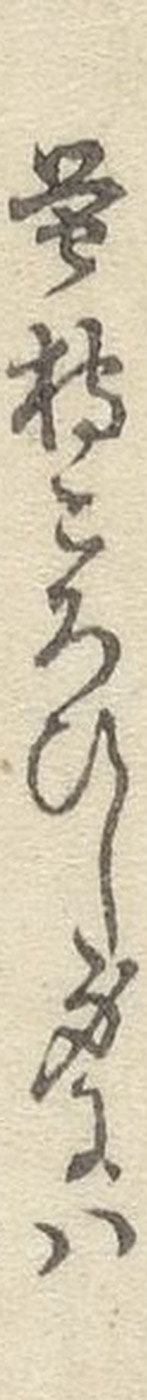蛍持ころひし身には
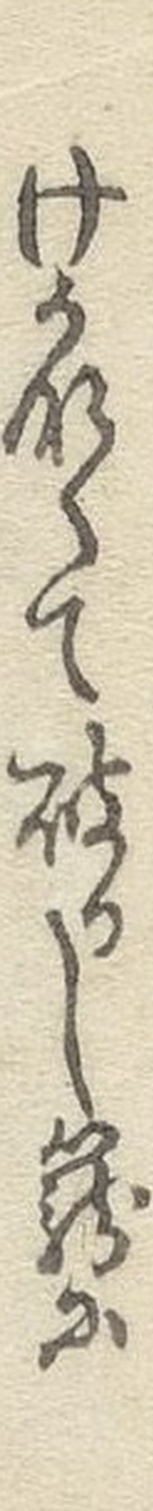けかなくて破りし籠に
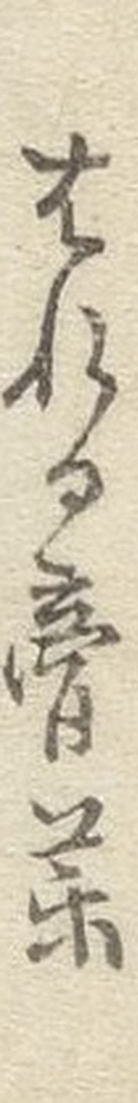はれる膏薬
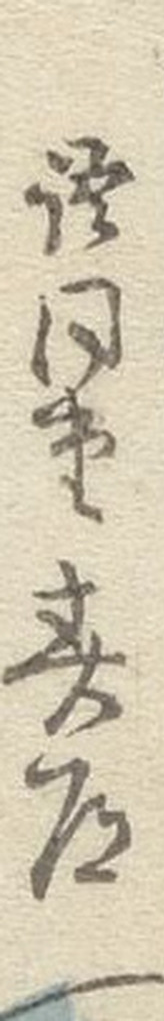語同堂春道
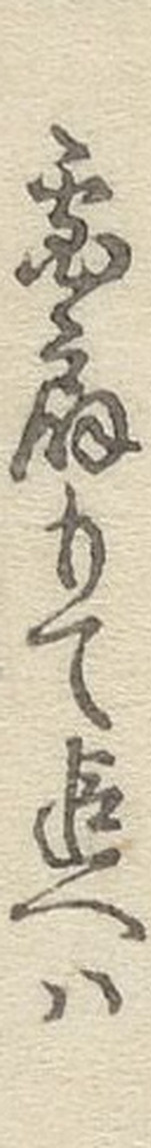団扇もて追へは
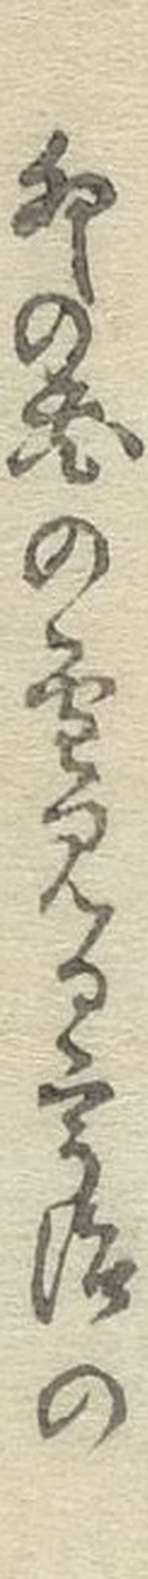卯の花の雪見る宇治の
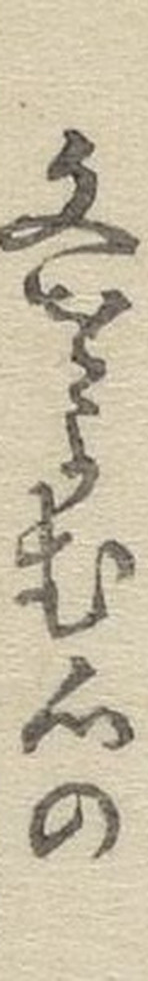文をよむ心の
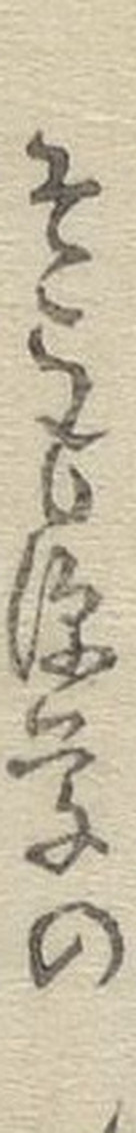そこも深草の
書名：Picture Album of People with Kyōka (Light Verse) (Kyōka shiki jinbutsu 狂歌四季人物)
